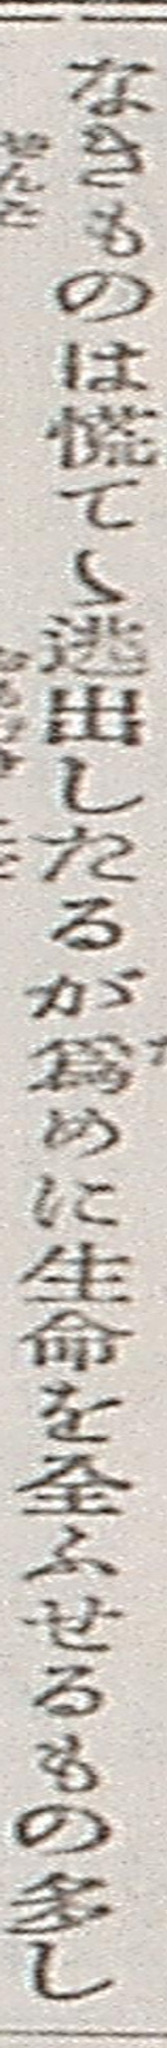なきものは慌てゝ逃出したるが為めに生命を全ふせるもの多し
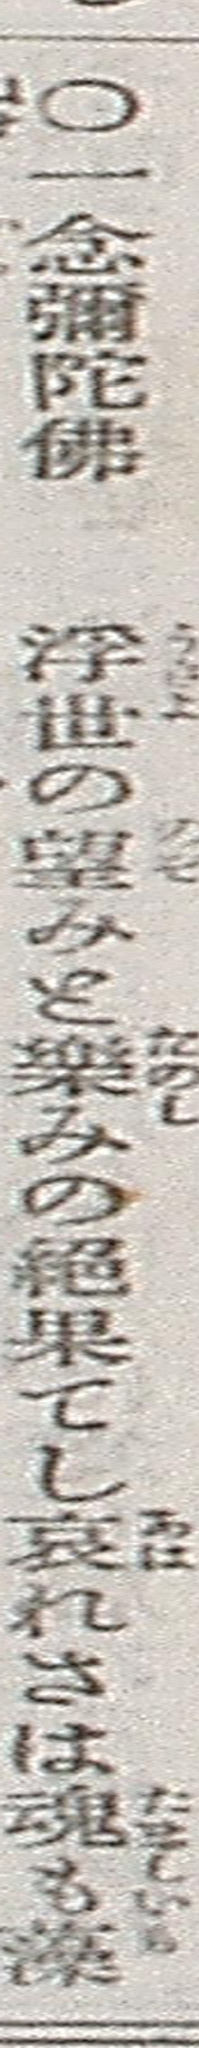○一念弥陀佛浮世の望みと楽みの絶果てし哀れさは魂も藻
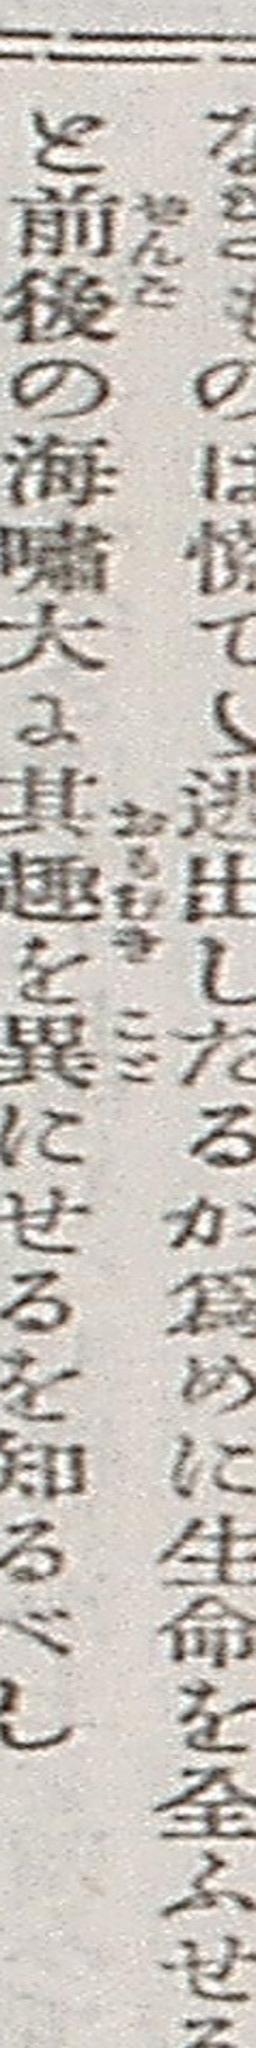と前後の海嘯大に其趣を異にせるを知るべし
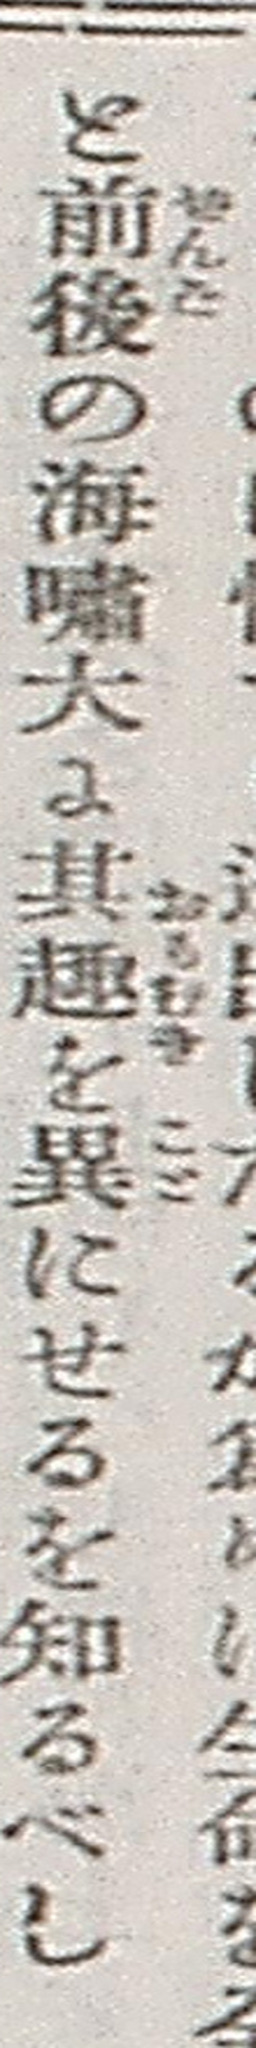と前後の海嘯大に其趣を異にせるを知るべし
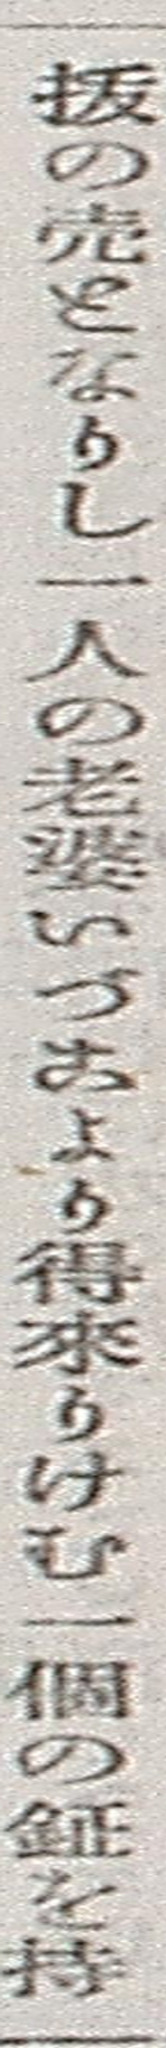抜の売となりし一人の老婆いづこより得来りけむ一個の鉦を持

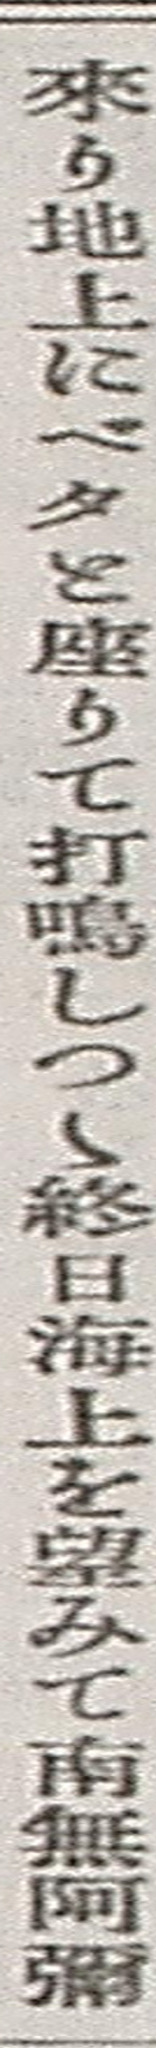来り地上にペタと座りて打鳴しつゝ終日海上を望みて南無阿弥
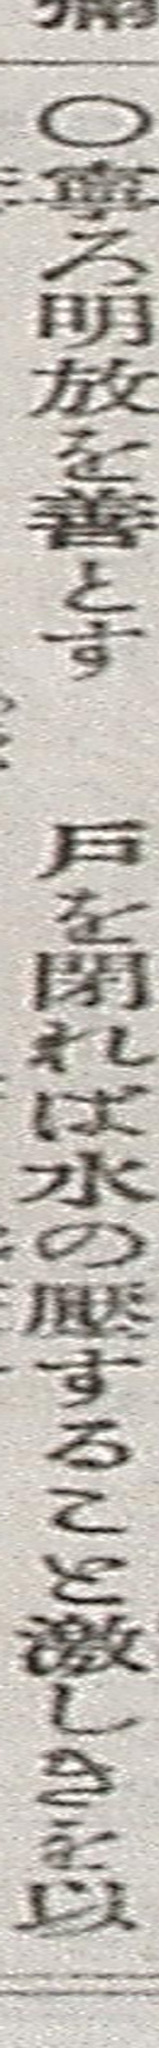○寧ろ明放を善とす戸を閉れば水の圧すること激しきを以
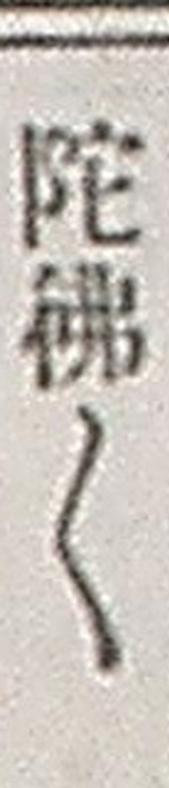陀仏〳〵
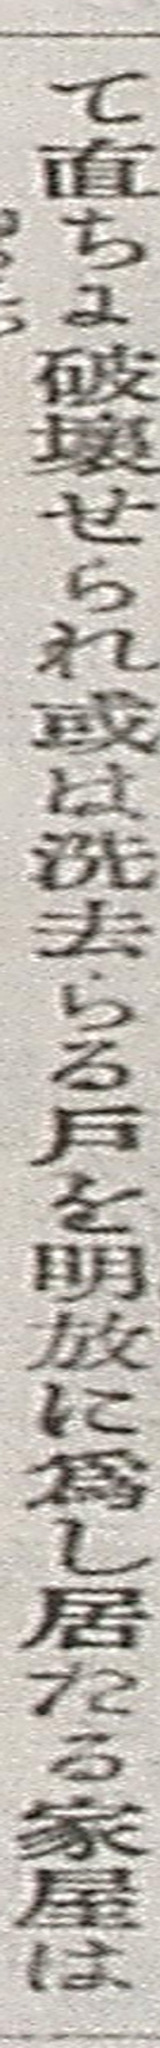て直ちに破壊せられ或は洗去らる戸を明放に為し居たる家屋は
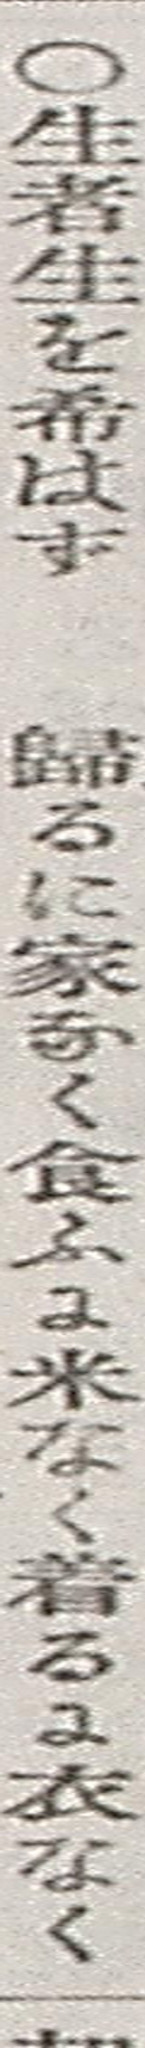○生者生を希はず帰るに家なく食ふに米なく着るに衣なく
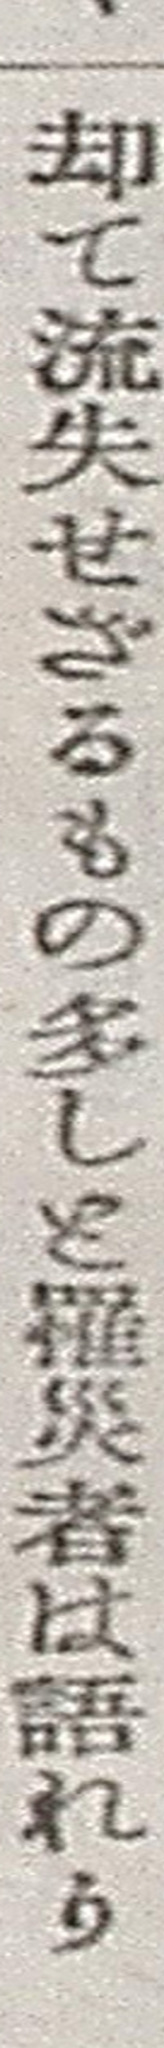却て流失せざるもの多しと罹災者は語れり
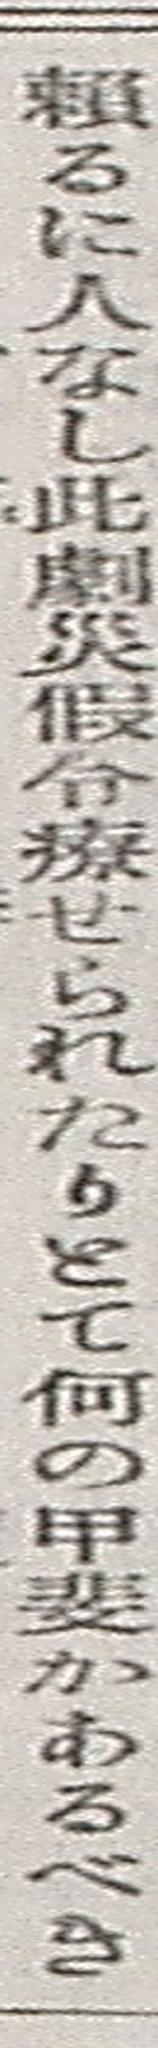頼るに人なし此劇災仮令療せられたりとて何の甲斐かあるべき
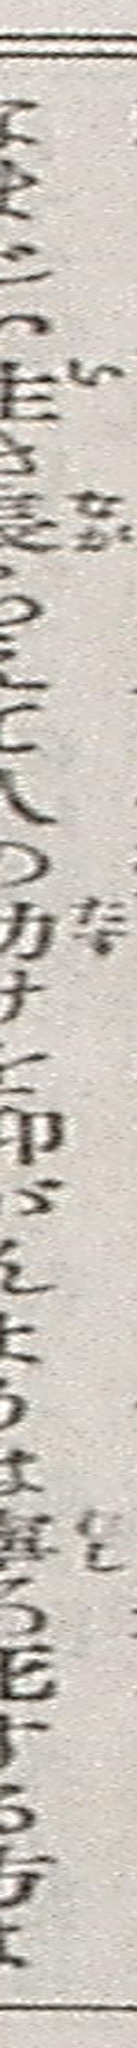なまじい生き長らえて人の助けを仰がんよりは寧ろ死する方よ
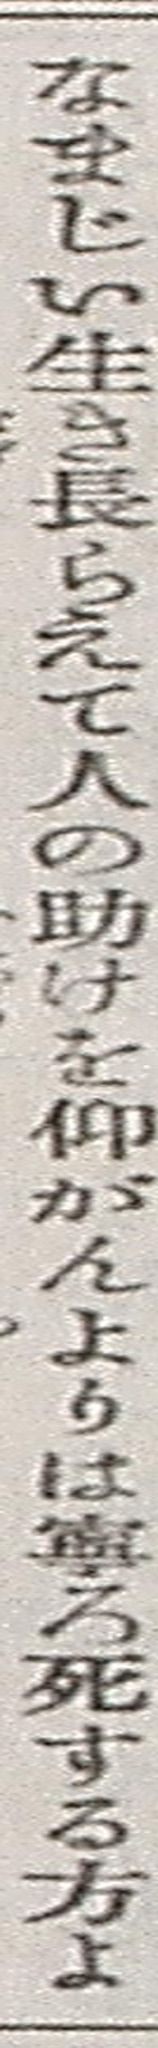なまじい生き長らえて人の助けを仰がんよりは寧ろ死する方よ
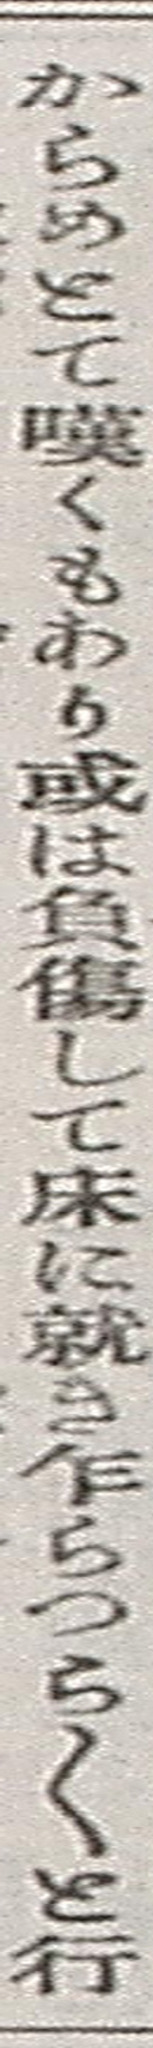からめとて嘆くもあり或は負傷して床に就き乍らつら〳〵と行
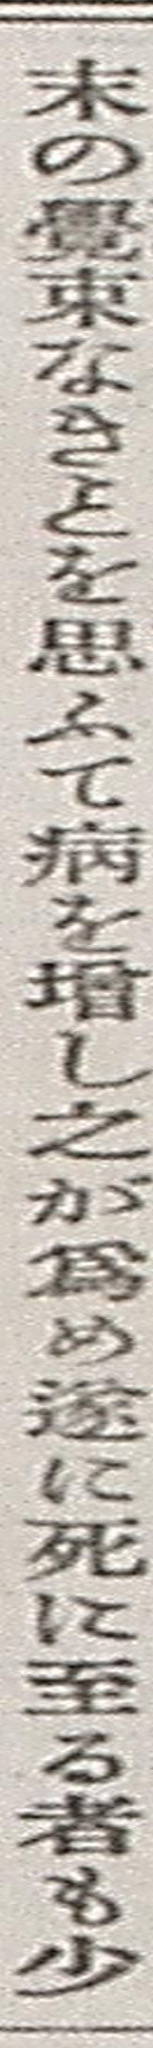末の覚束なきことを思ふて病を増して之が為め遂に死に至る者も少
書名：風俗畫報臨時増刊第百二十號　大海嘯被害録（下）
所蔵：東京大学地震研究所図書室 Earthquake Research Institute Library, The University of Tokyo, JAPAN
